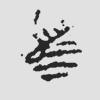獻馬
